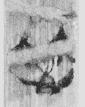{仌斤心}
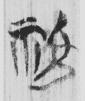{示兔}
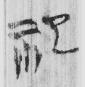祀
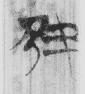隹
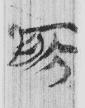所
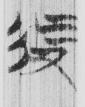役
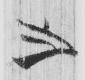之
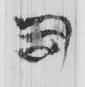司
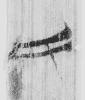民
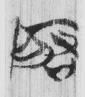啟
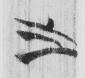之
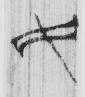民
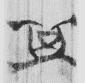𠀠
